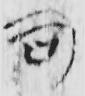司
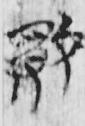敗
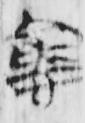愴
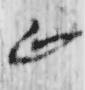㠯（以）
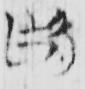○（廷）
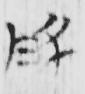阩
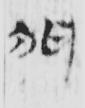門
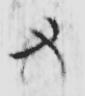又
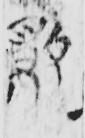敗
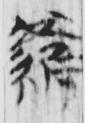羅
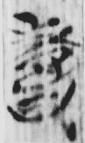壽
